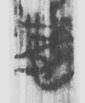志
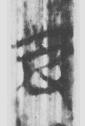皮
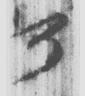乃
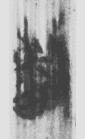{番攴}
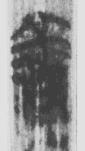善
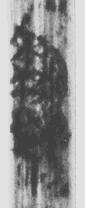執
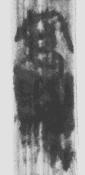{宀肙心}
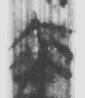亦
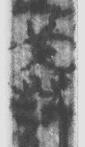戒
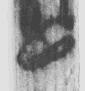㠯（以）
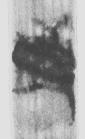{立寺}
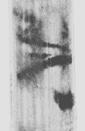之
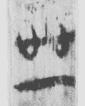{廿廿一}
